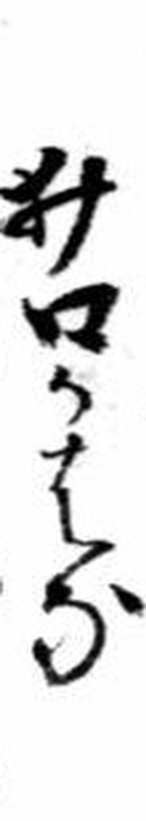井口かはな
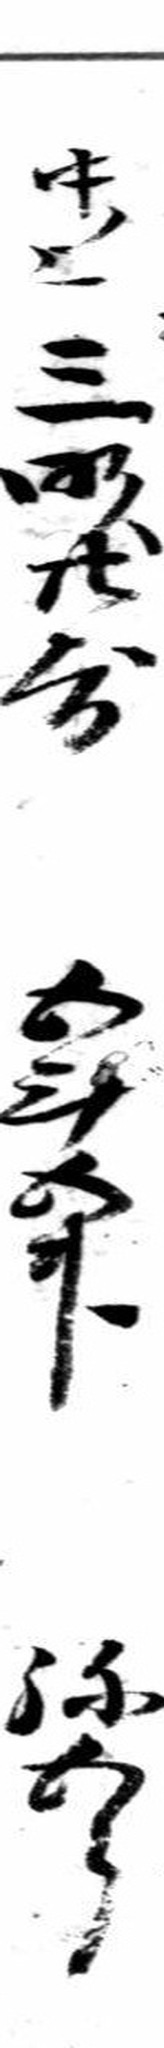中ノ上三畝廿歩五斗五升弥五郎
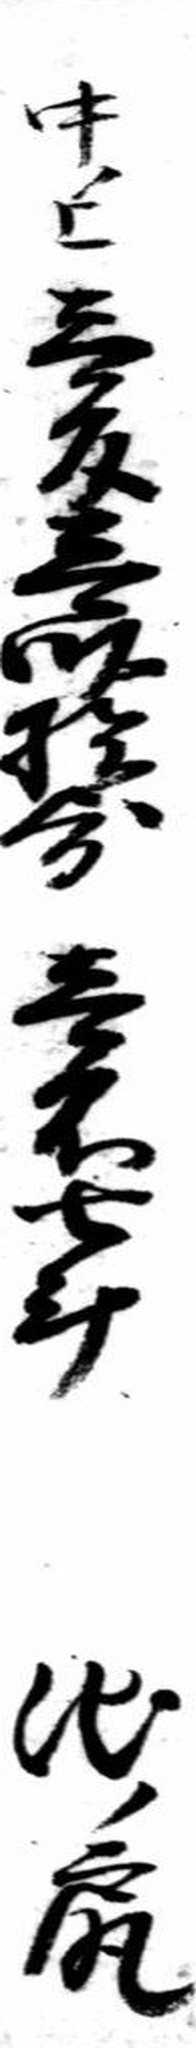中ノ上壱反壱畝拾歩壱石七斗池ノ尻
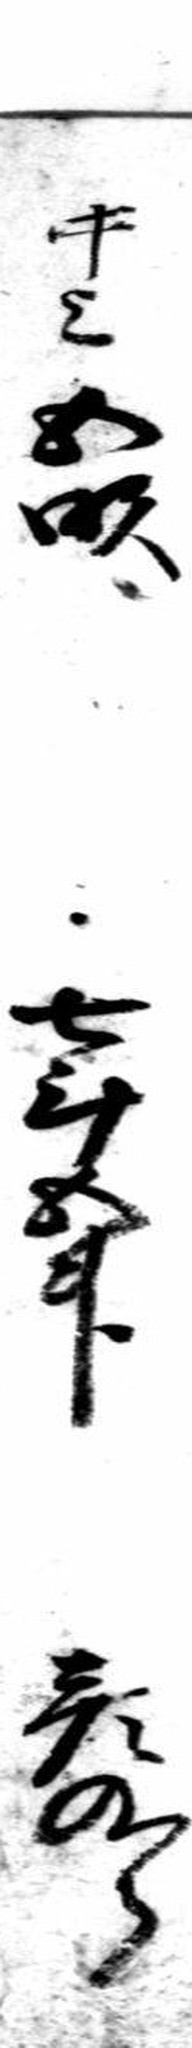中上五畝七斗五升彦九郎

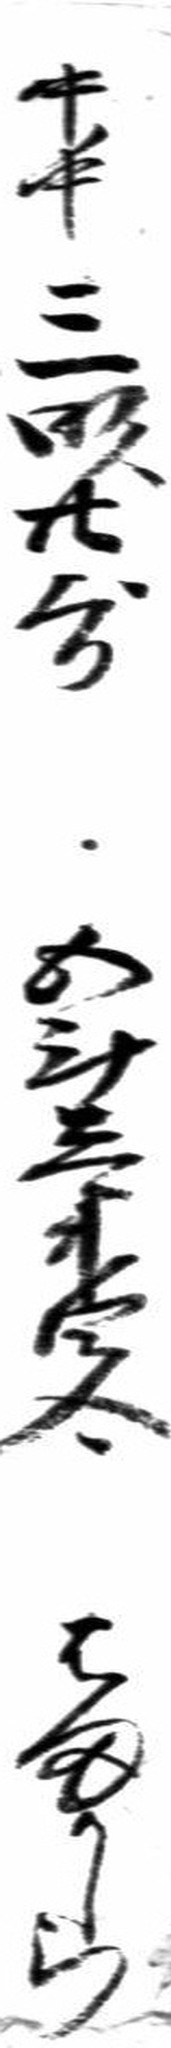中ノ中三畝廿歩五斗壱升四合はまかしら
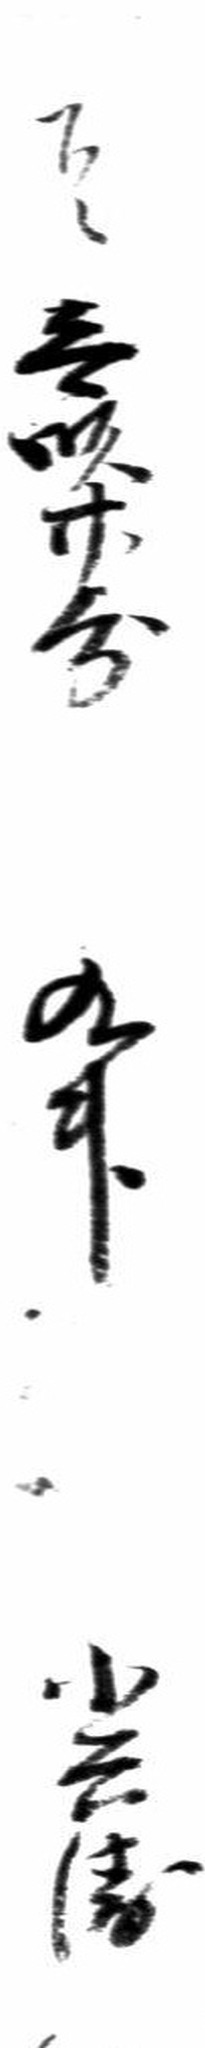下々壱畝廿歩九升小兵衛
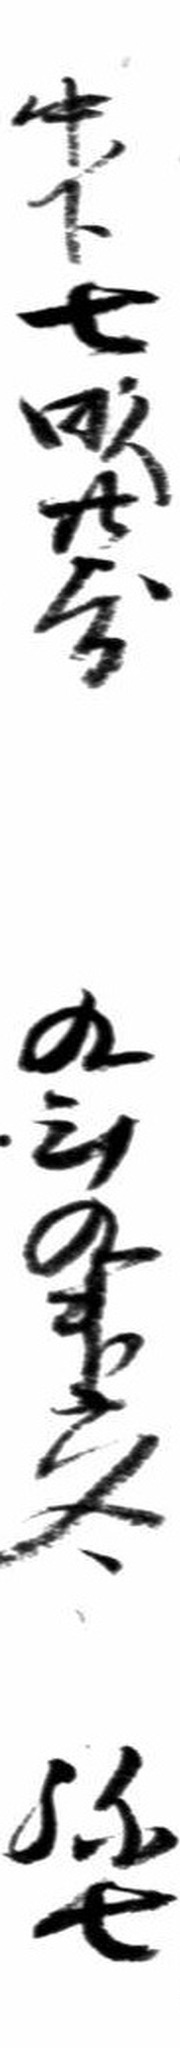中ノ下七畝廿歩九斗九升六合弥七
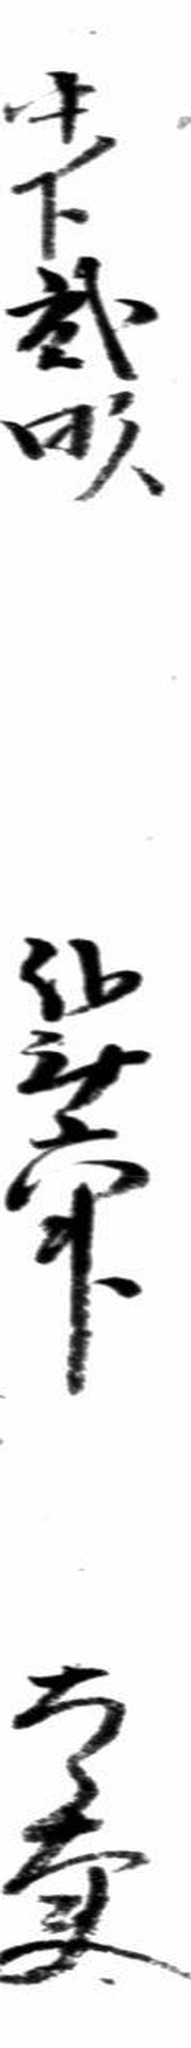中ノ下弐畝弐斗六升大郎大夫
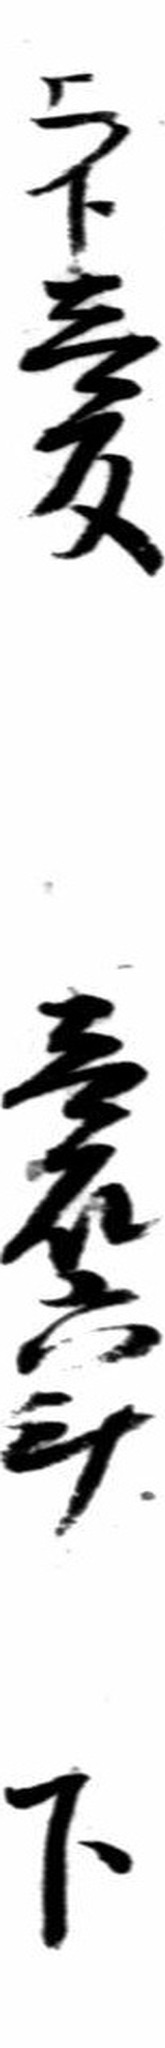上ノ下壱反壱石六斗下
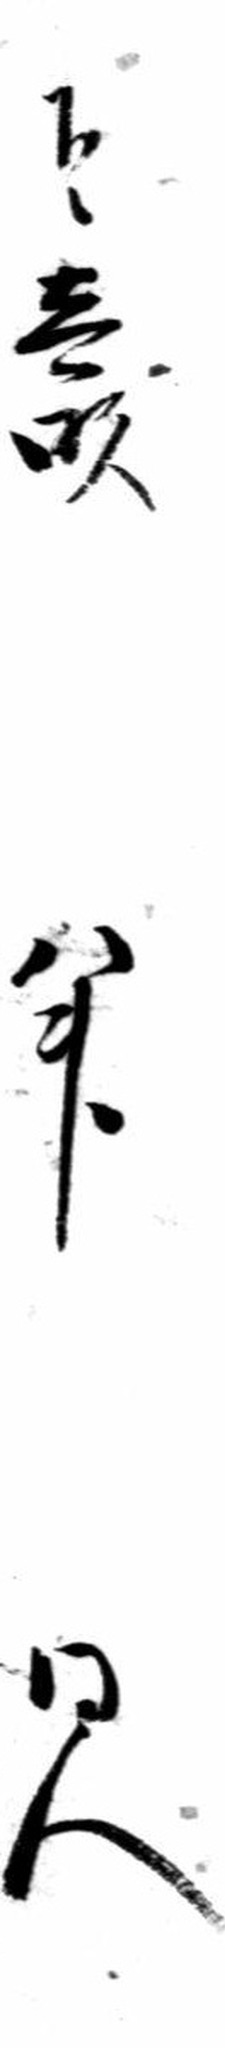下々壱畝八升同人
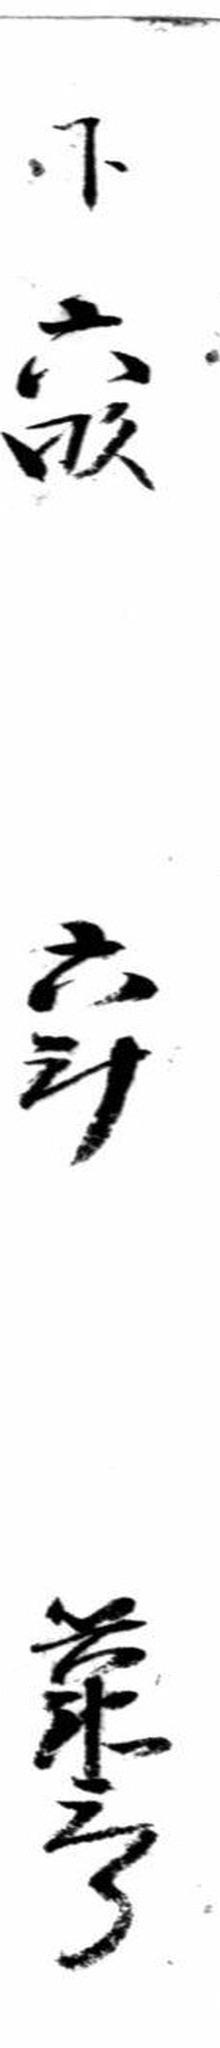下六畝六斗兵衛三郎
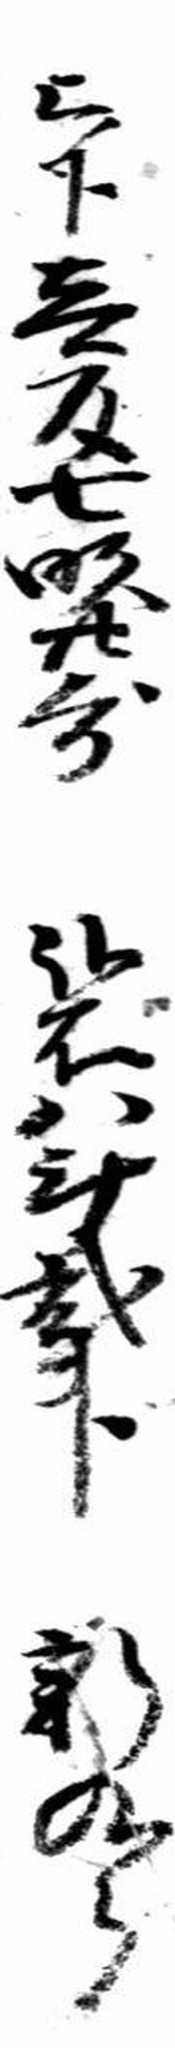上ノ下壱反七畝廿歩弐石八斗弐升新九郎
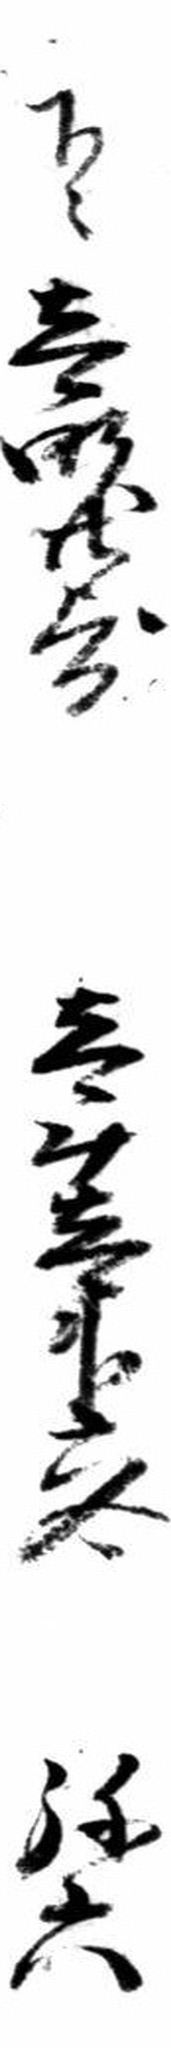下々壱畝廿歩壱斗壱升六合弥六
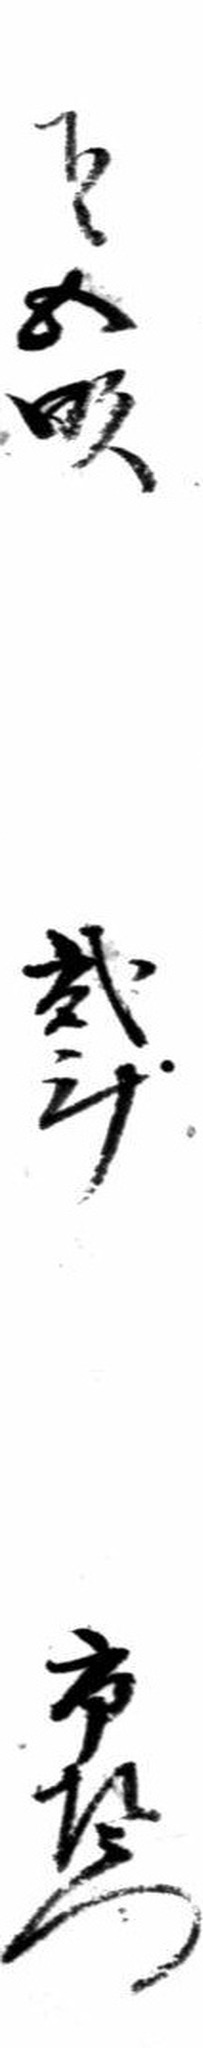下々五畝弐斗市左衛門

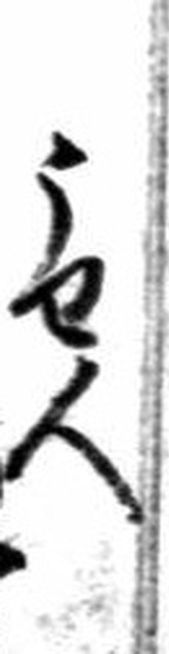うせ人
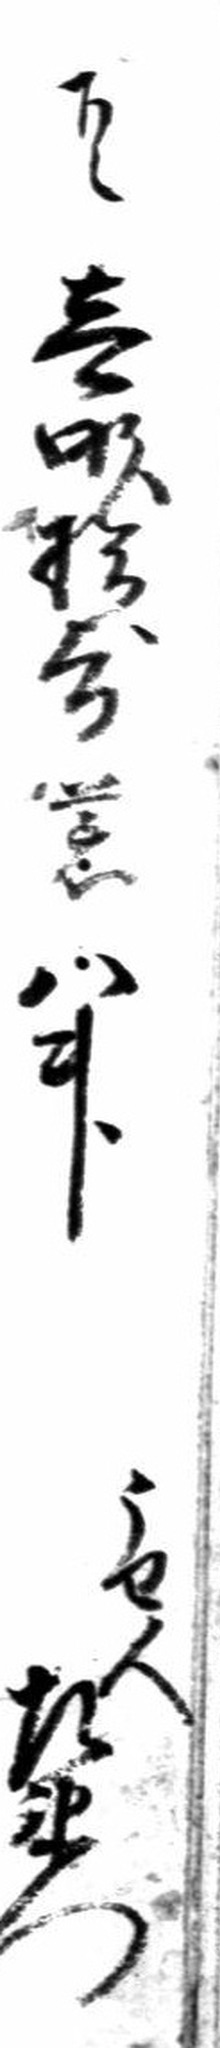下々壱畝拾歩荒八升左衛門
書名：若州三方郡之内世久見浦御検地帳（世久見浦検地帳写）
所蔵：福井県文書館 Fukui Prefectural Archives
